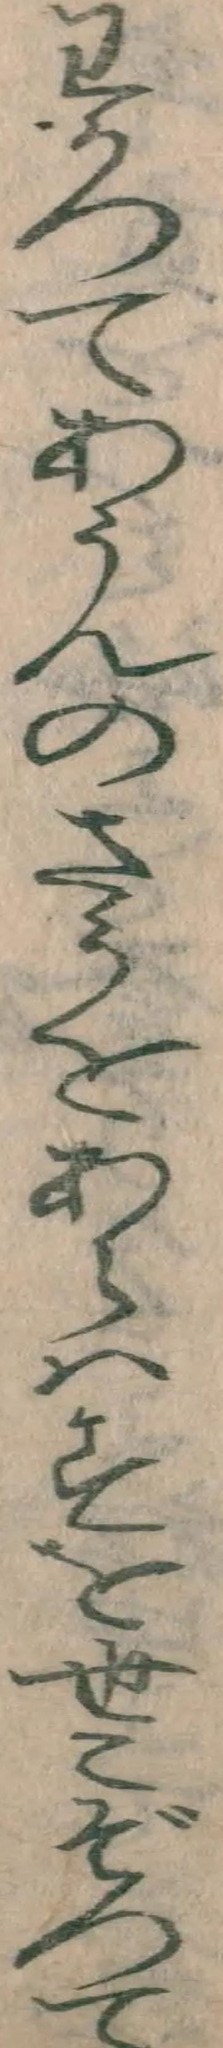わかつてあうんのさうをあらはすを世こぞつて
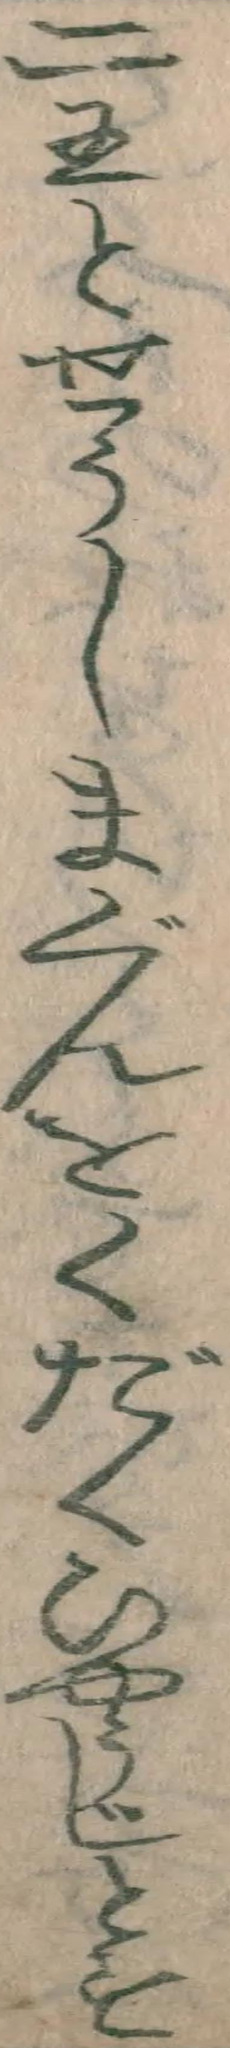二王とせうしまぐんをくだくひやうじとす
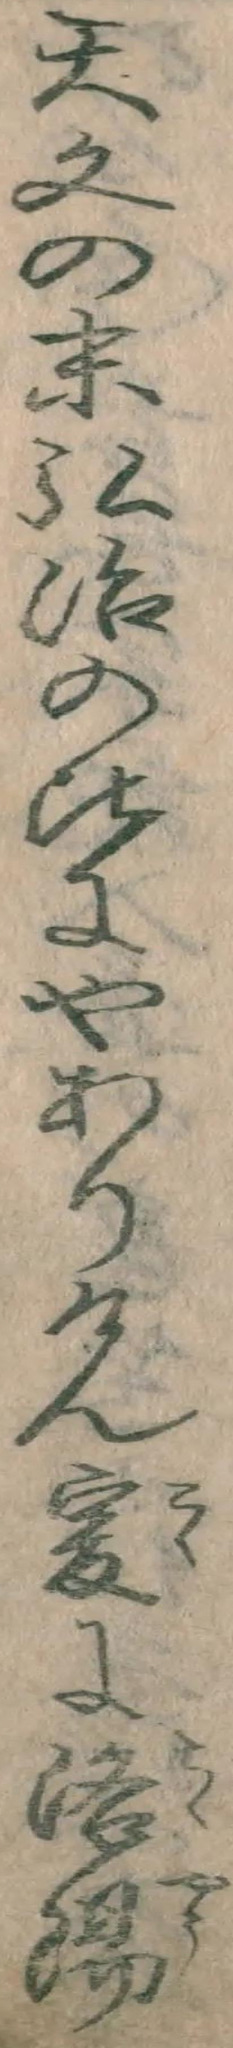天文の末弘治の頃にやありけん爰に洛陽
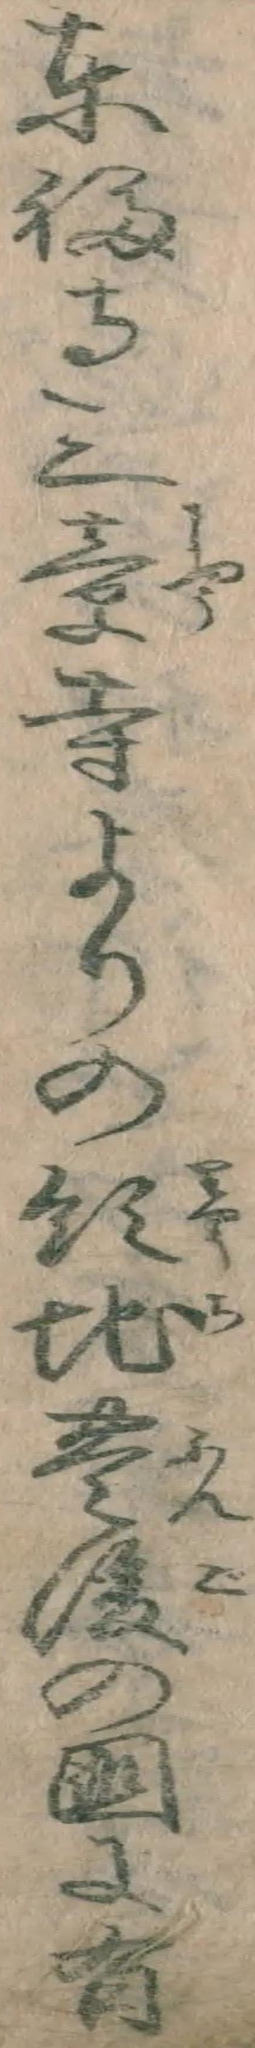東福寺三章寺よりの領地豊後の国に有
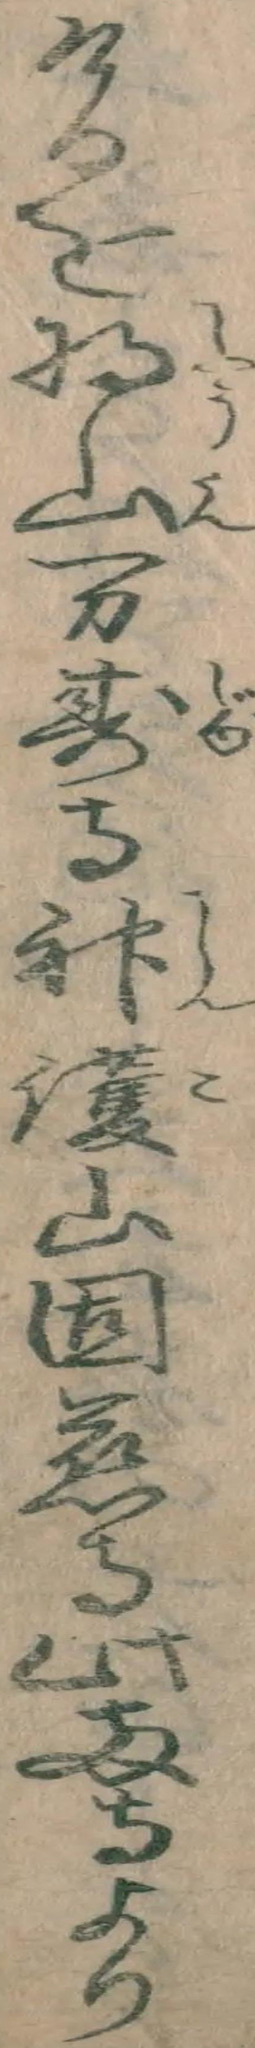けるを将山万寿寺神護山固慈寺此両寺より

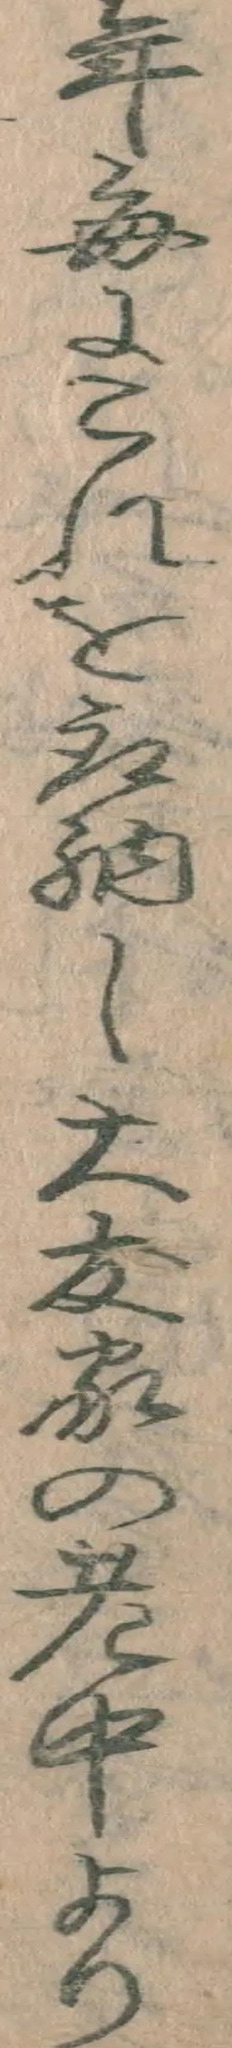年毎にこれを取納し大友家の老中より
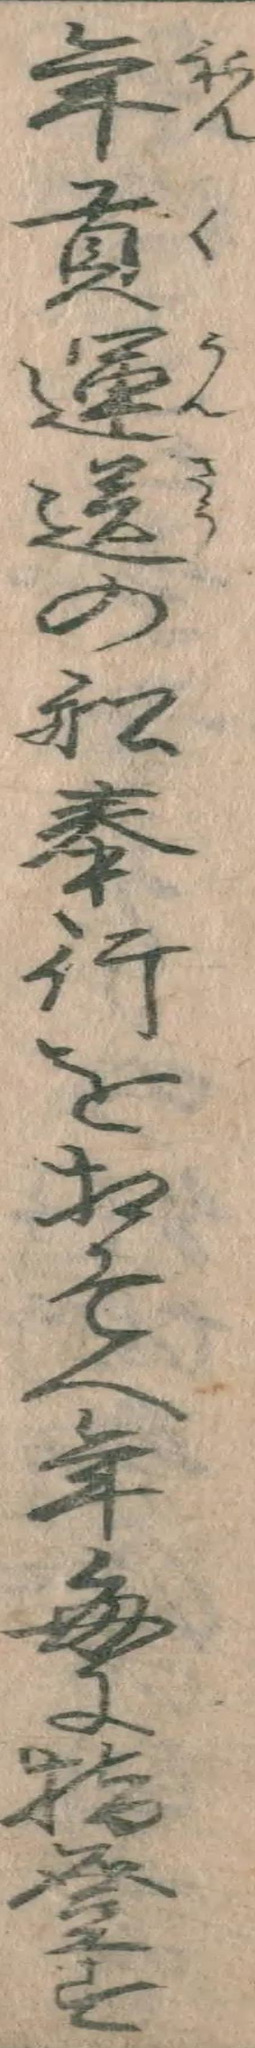年貢運送の船奉行を相そへ年毎に指登す
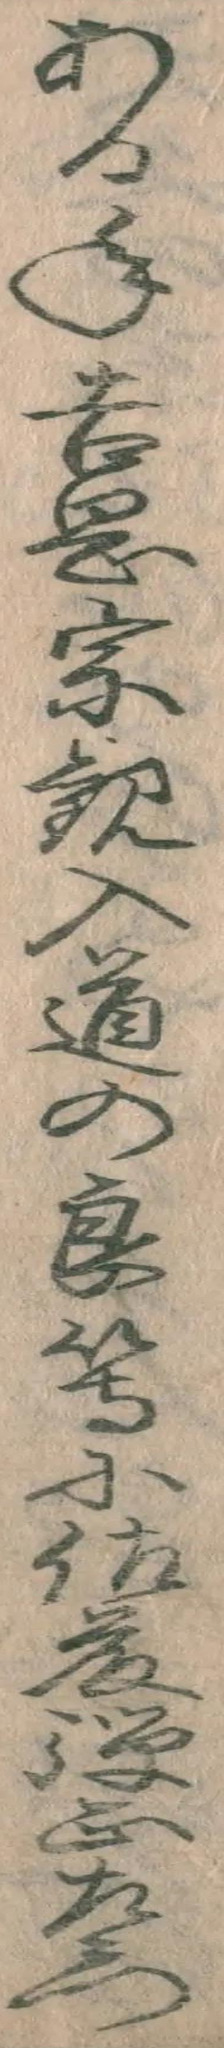ある年吉岡宗観入道の良等に佐藤弾正左衛門
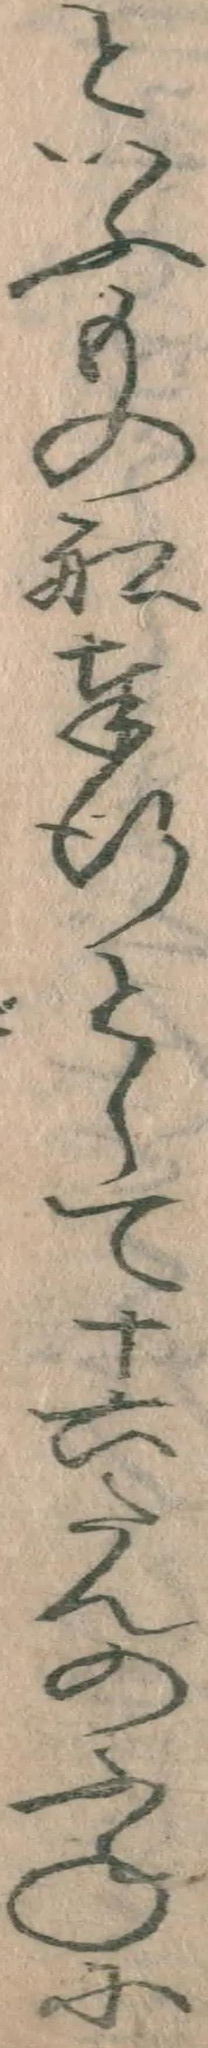といふもの船奉行として十六たんのふねに
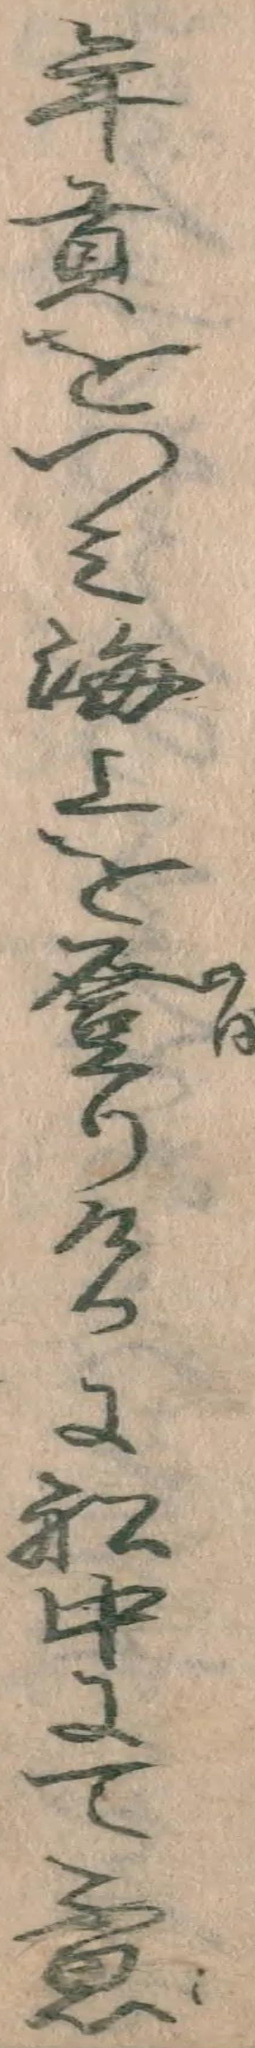年貢をつみ海上を登りけるに船中にて不思
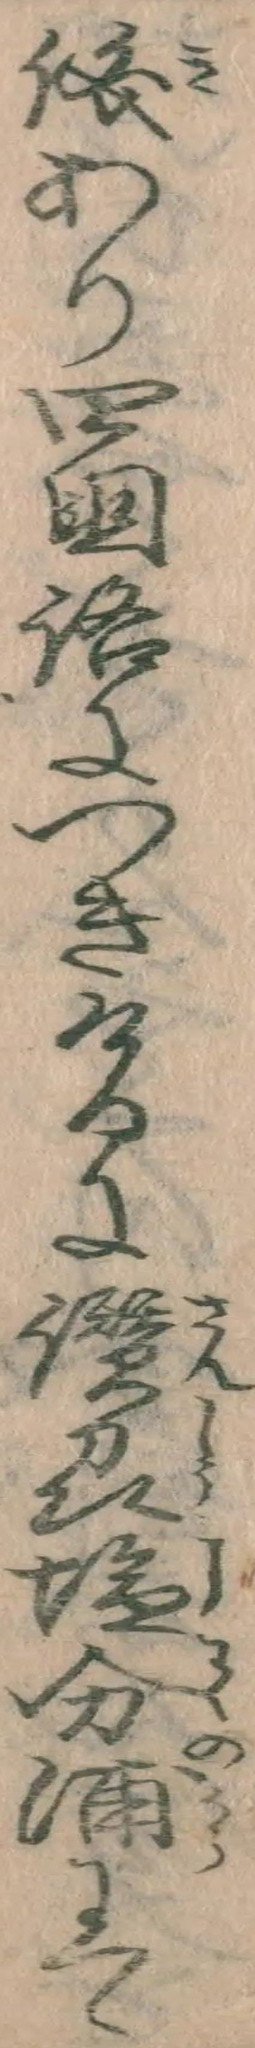儀あり四国路につきけるに讃州塩分浦にて
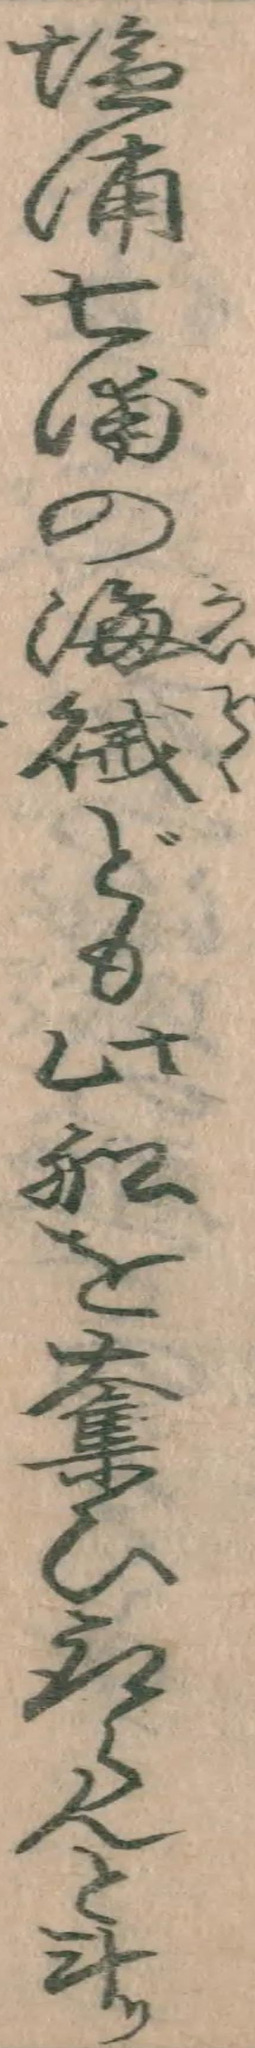塩浦七浦の海賊ども此船を奪ひ取らんと斗
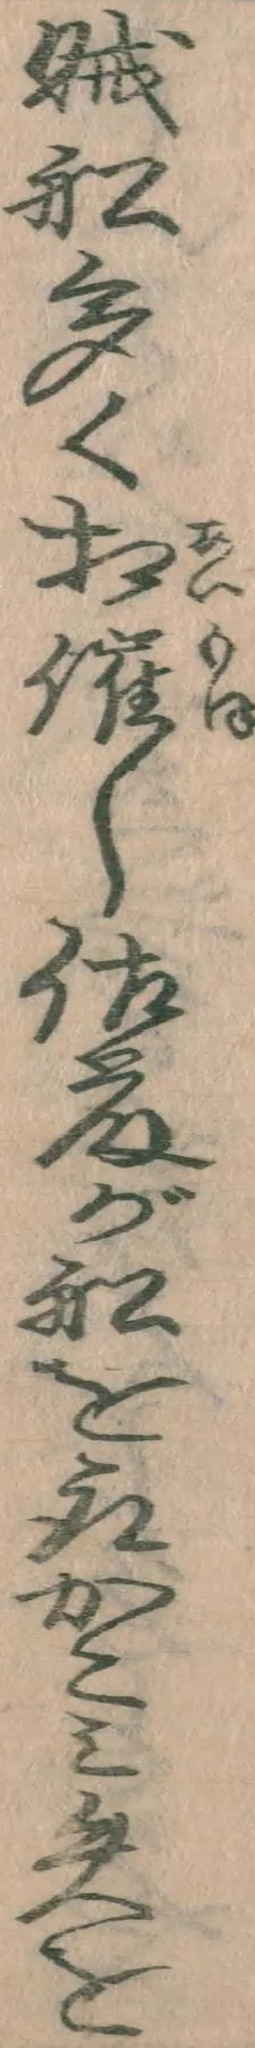賊船多く相催し佐藤が船を取かこみ矢を
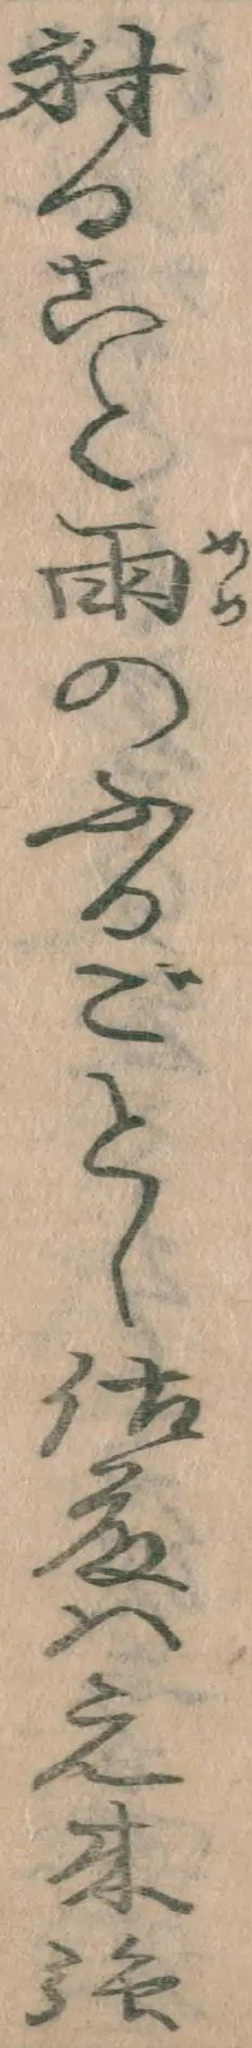射ること雨のふるごとし佐藤は元来強
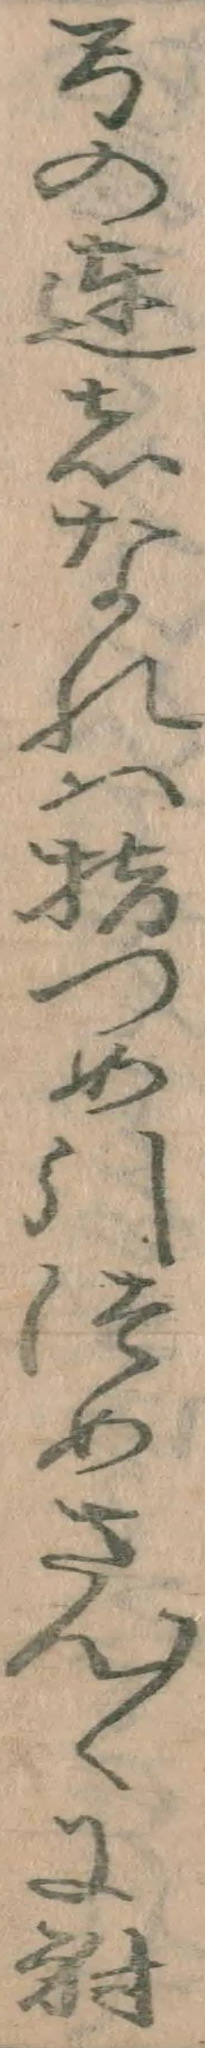弓の達者なれは指つめ引つめさん〳〵に射
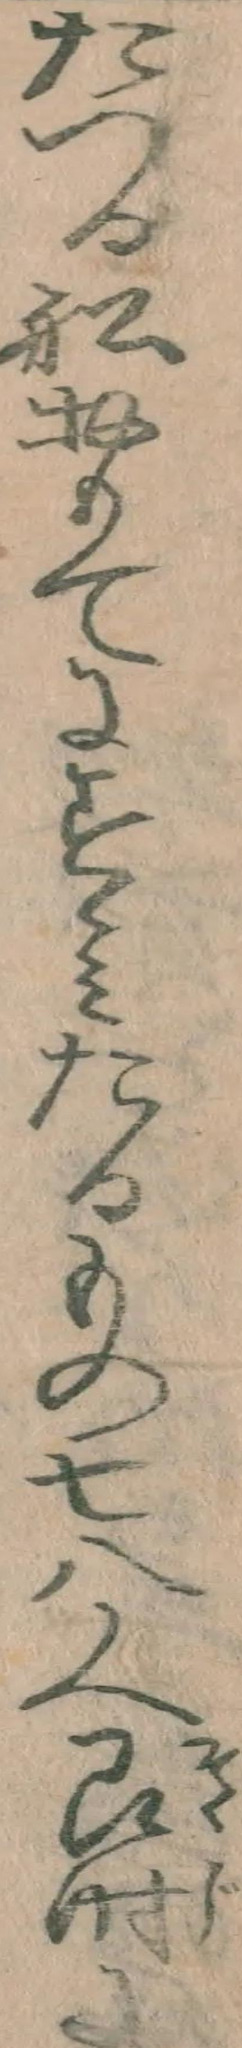たつる船おもてにすゝみたるもの七八人即時に
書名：怪談御伽童 5巻. [1]
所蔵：国立国会図書館 National Diet Library, JAPAN
